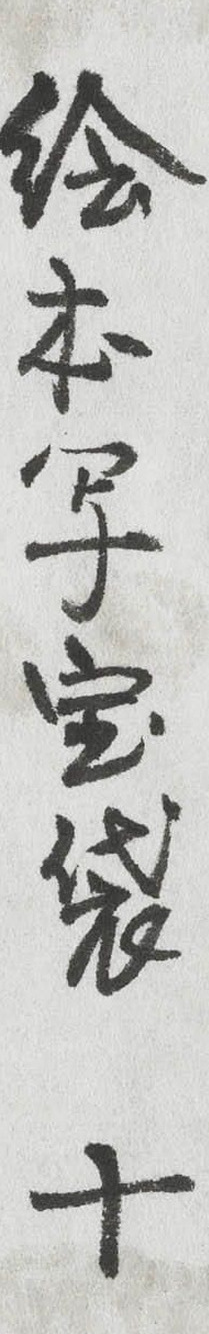絵本写宝袋十
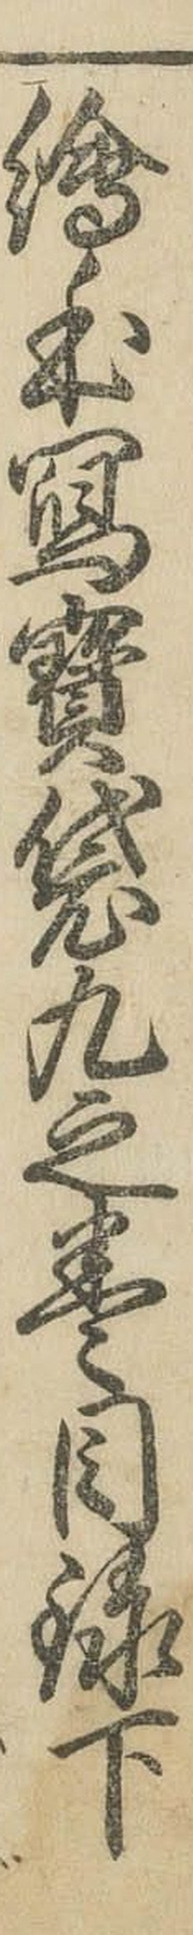絵本写宝袋九之巻目録下
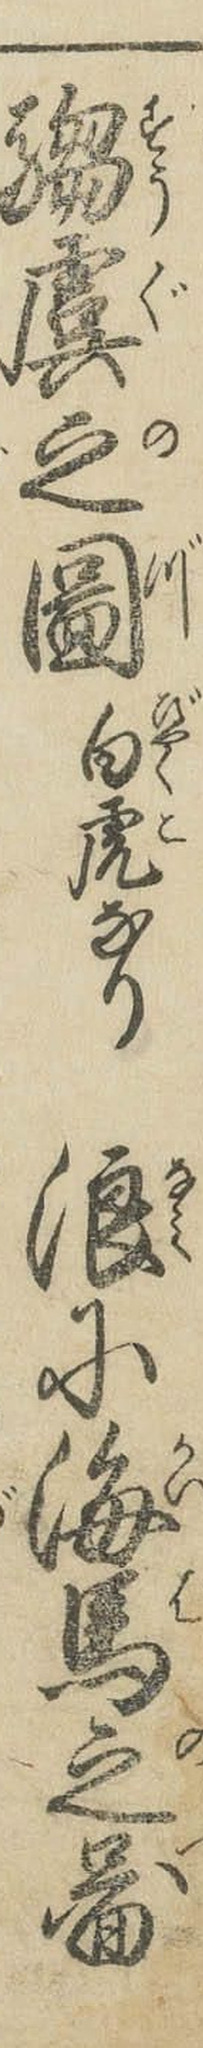騶虞之図白虎なり浪に海馬之図
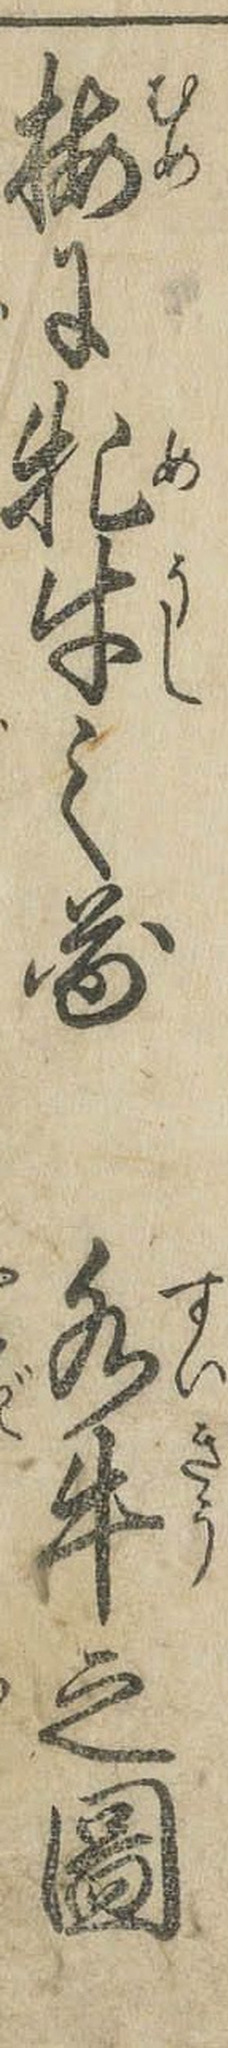梅に牝牛之図水牛之図
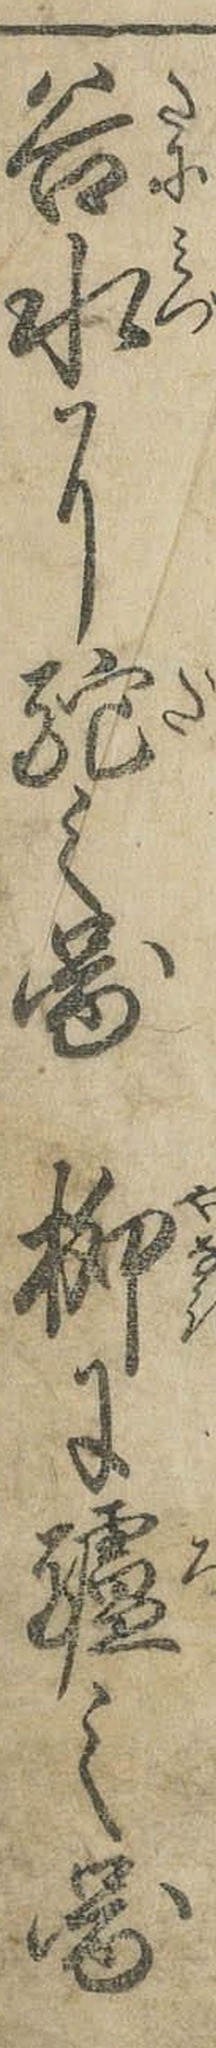谷水に駝之図柳に驢之図

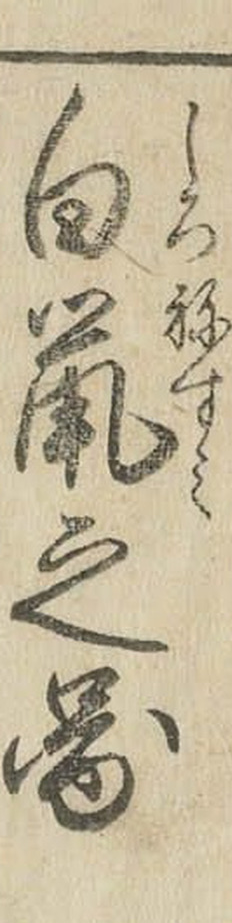白鼠之図
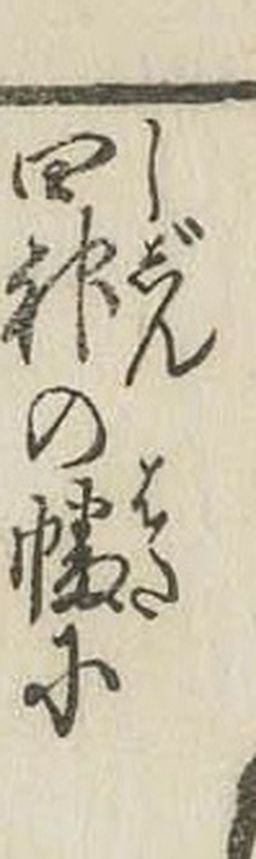四神の幡に

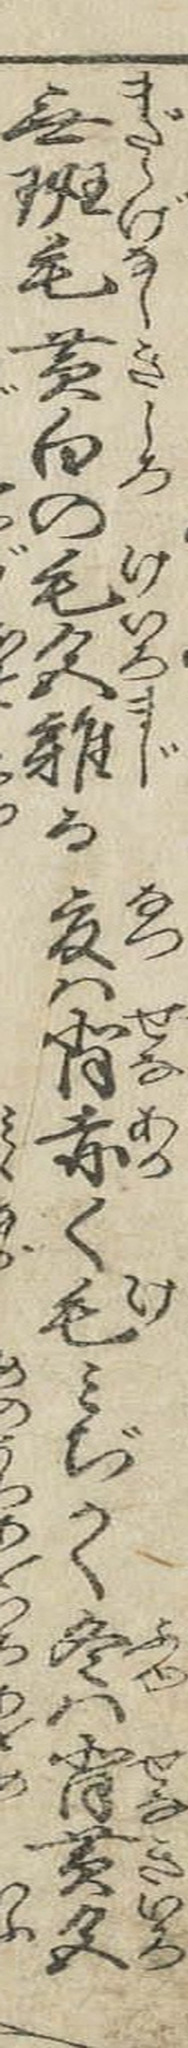無斑毛黄白の毛色雑る夏は背赤く毛みぢかく冬は背黄色
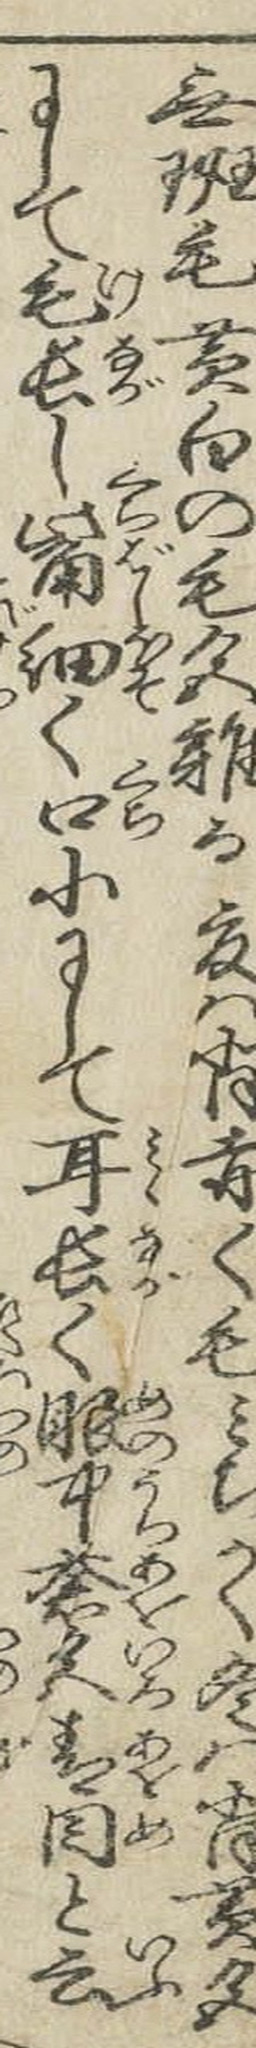にして毛長し觜細く口小にして耳長く眼中蒼色青目と云
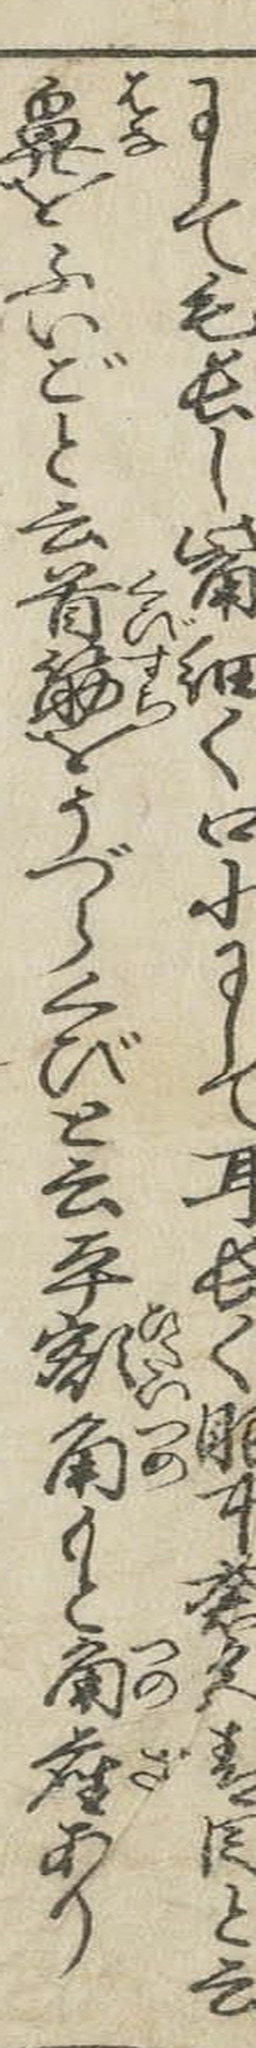鼻をふいごと云首筋をうづらくびと云平額角もと角座あり
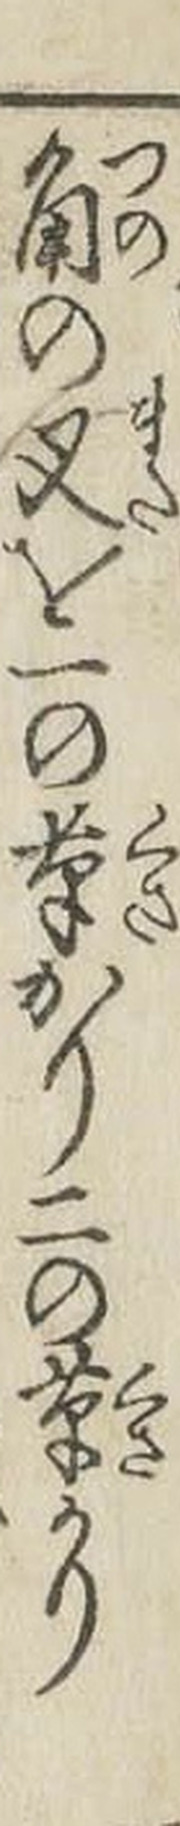角の又を一の草かり二の草かり
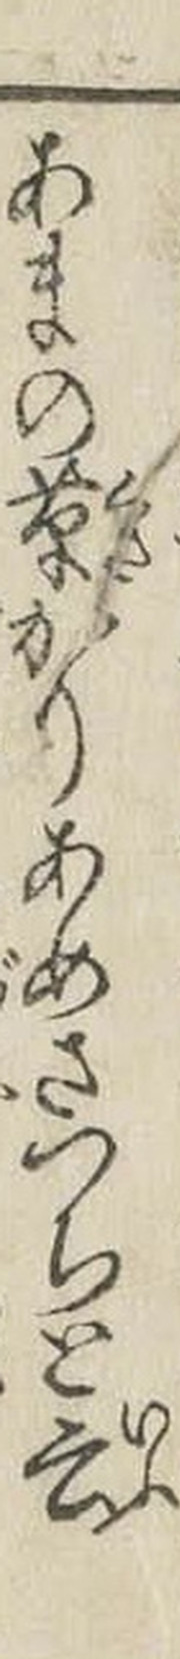あまの草かりあめさつちと云
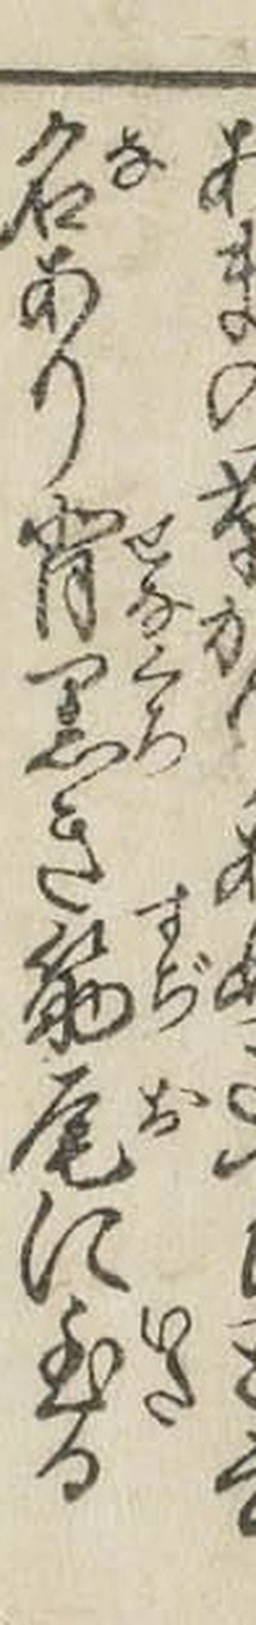名あり背黒き筋尾に至る
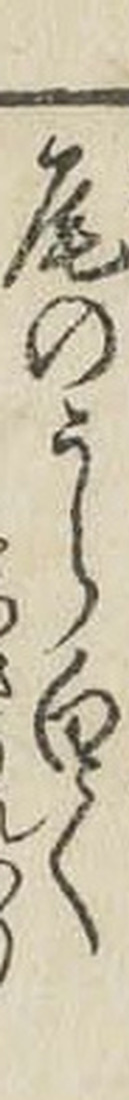尾のうら白く
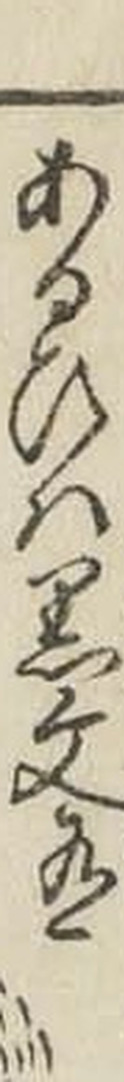あるひは黒文有
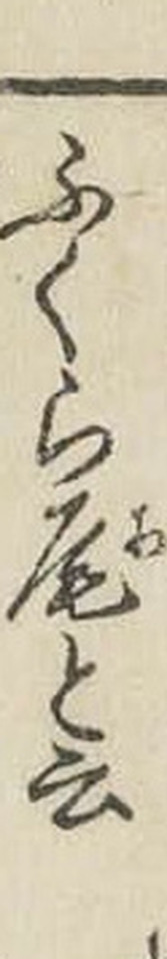ふくら尾と云
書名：絵本写宝袋 9巻 9之巻下
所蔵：東京学芸大学教育コンテンツアーカイブ
